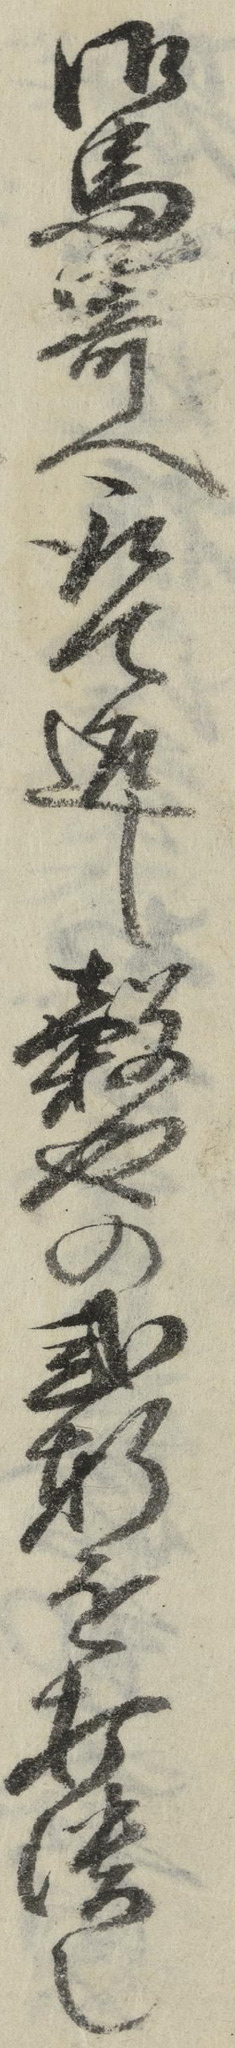御馬寄へ取て返し穀やの弐軒を打潰し
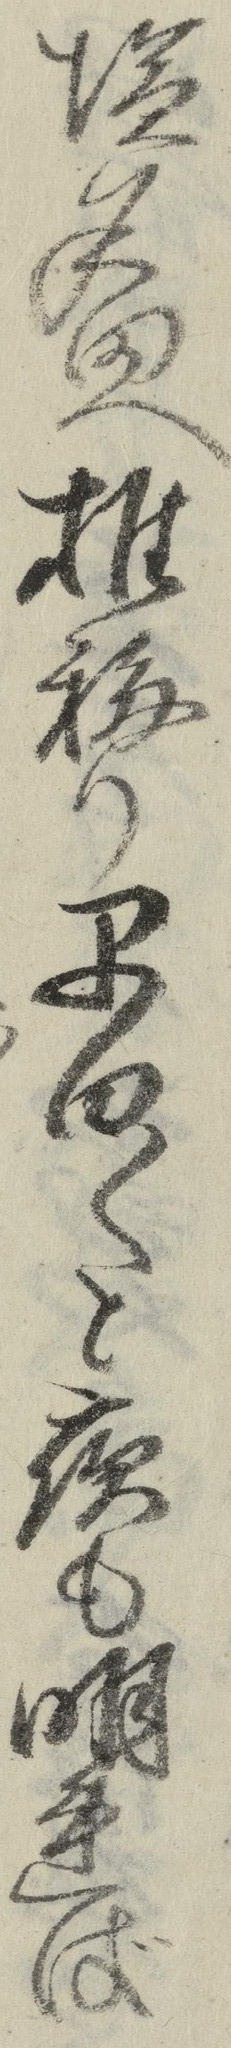塩名田へ推移り早白〳〵と夜も明れば
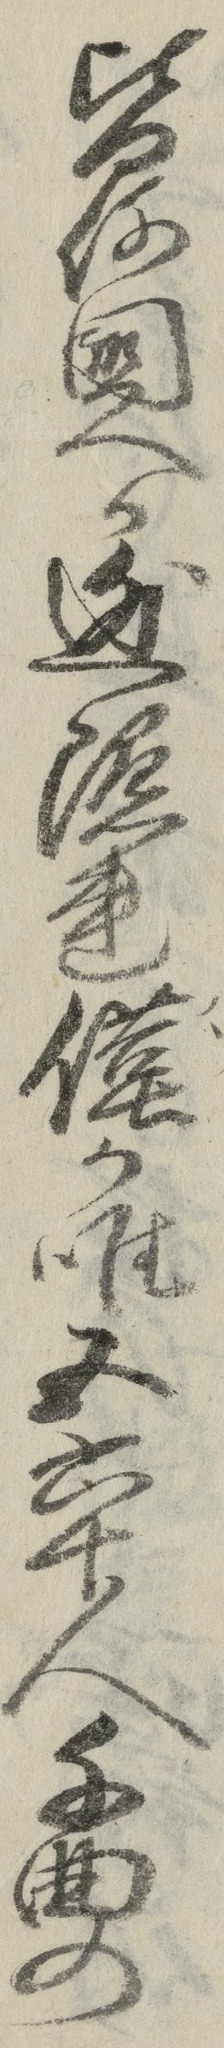皆何国へか逃隠れ僅か唯五六十人千曲の
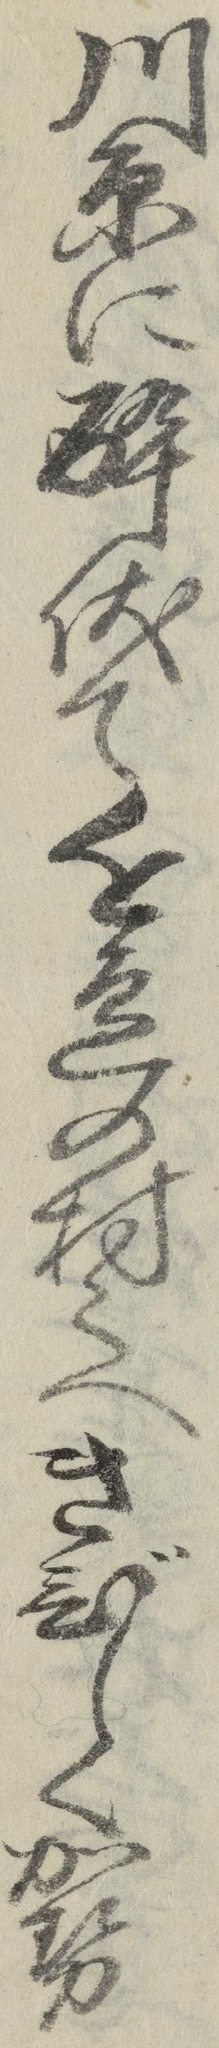川原に酔伏て近辺の村々へきびしく加勢
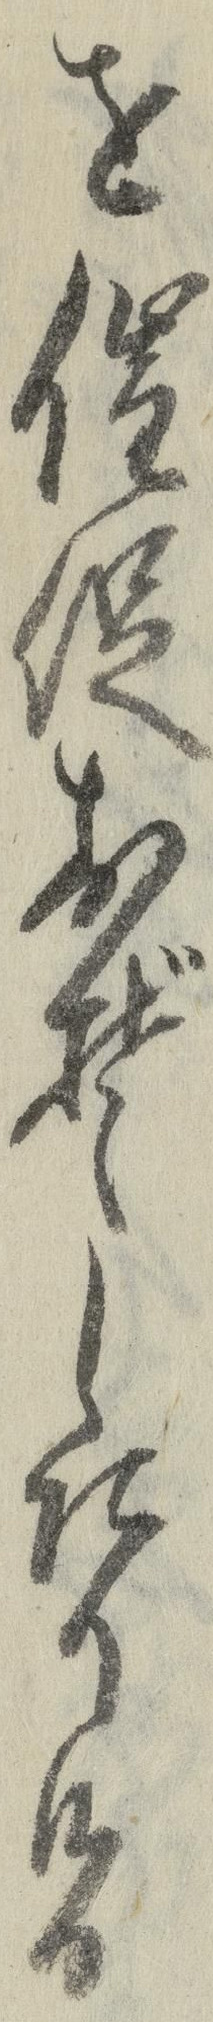を催促おぞしたりける
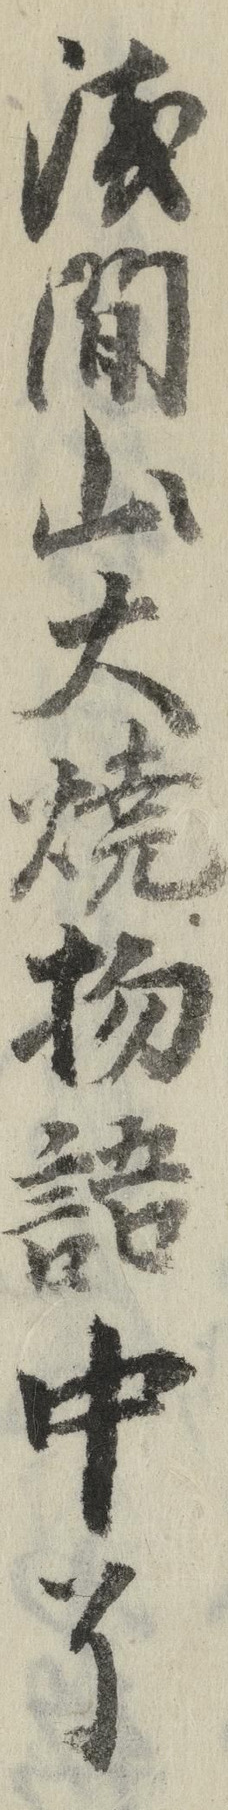浅間山大焼物語中了
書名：浅間大焼騒動記　中
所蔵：東京大学地震研究所図書室 Earthquake Research Institute Library, The University of Tokyo, JAPAN
